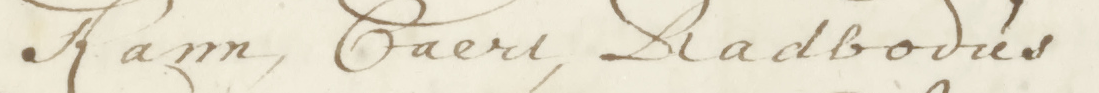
Kann, Caert, Radbodus,
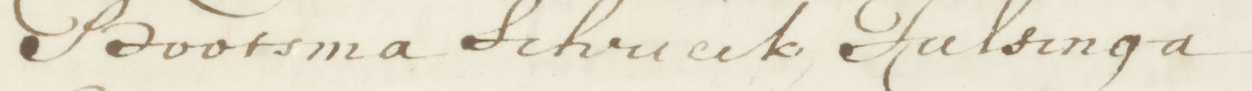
Bootsma, Schrieck, Julsinga,
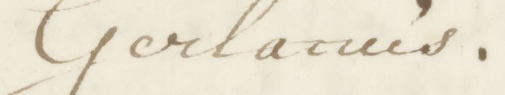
Gerlacius.
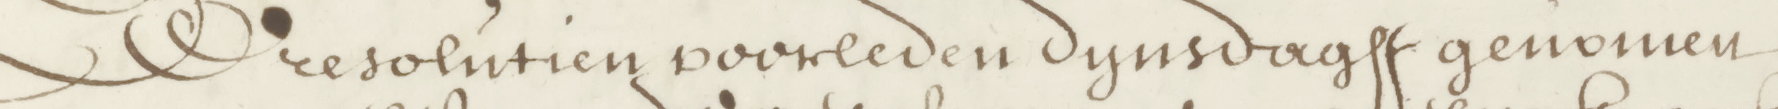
Dresolutien voorleden dijnsdagh genomen
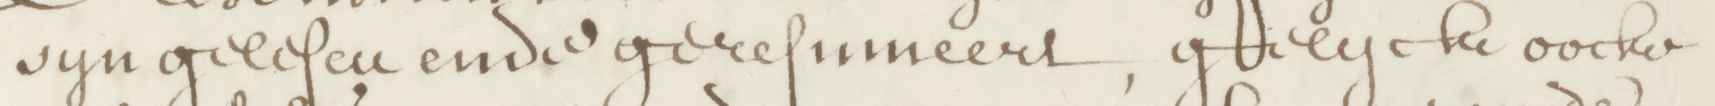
sijn gelesen ende geresumeert, gelijck oock
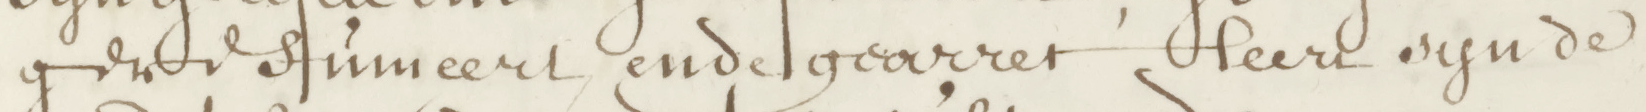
geresumeert ende gearresteert sijn de
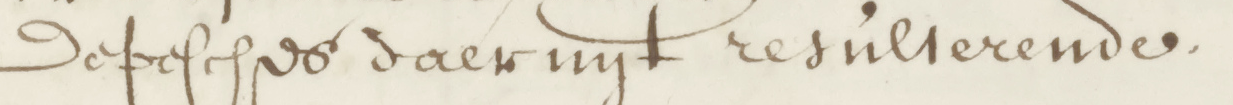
depesches daeruijt resulterende.
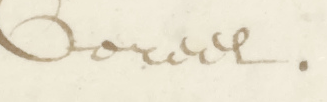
Boreel
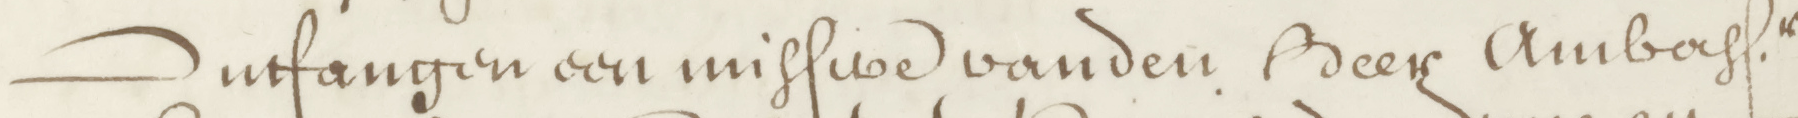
Ontfangen een missive vanden heer Ambassr
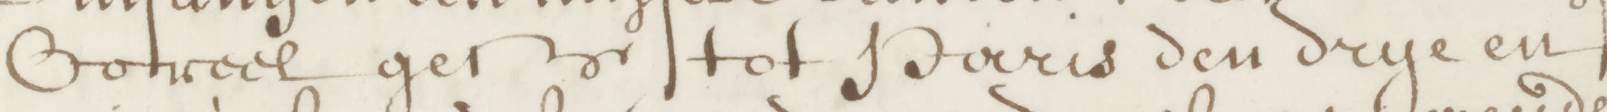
Boreel gesr tot Paris den drije en
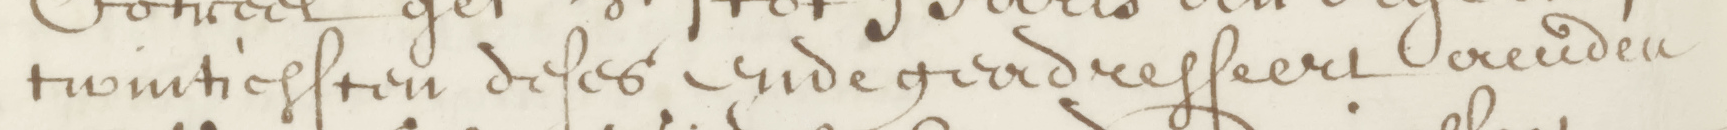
twintichsten deses ende geadresseert aenden
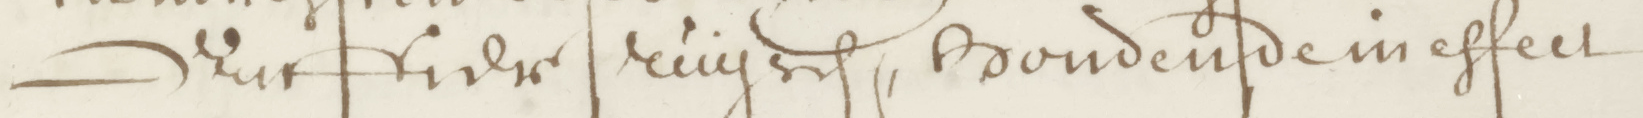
Griffier ruysch, houdende in effect
